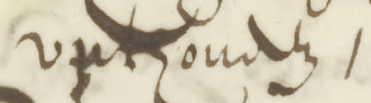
onthouden.
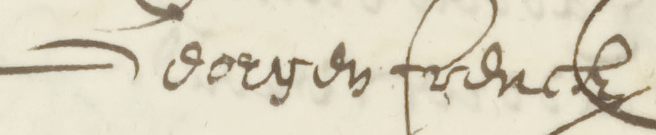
Georgen Frenk
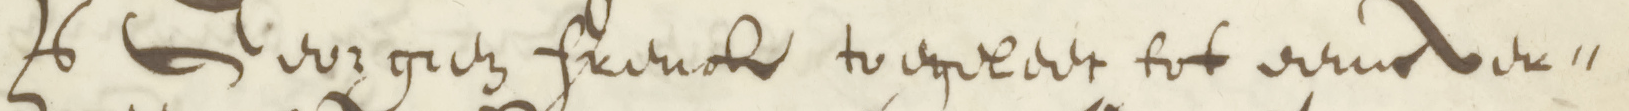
Is Georgien Frenck toegeleet tot eene ver„
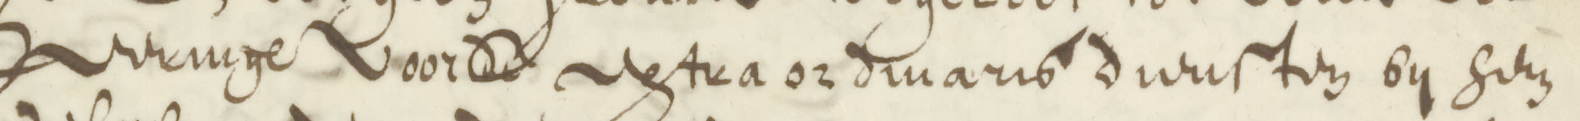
eeringe voorde extra ordinaris diensten by hem
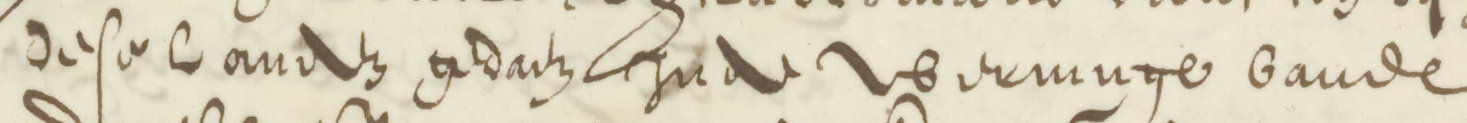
dese landen gedaen Inde weruinge vande
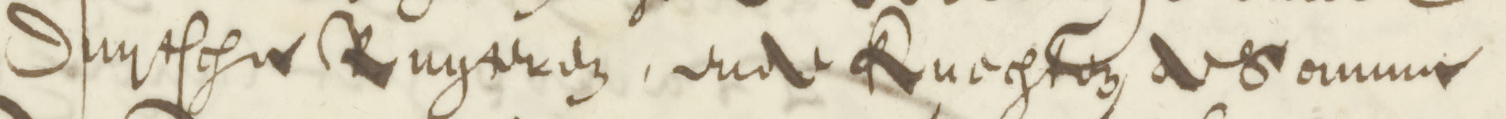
Duytsche Ruyteren, ende Knechten de Somme
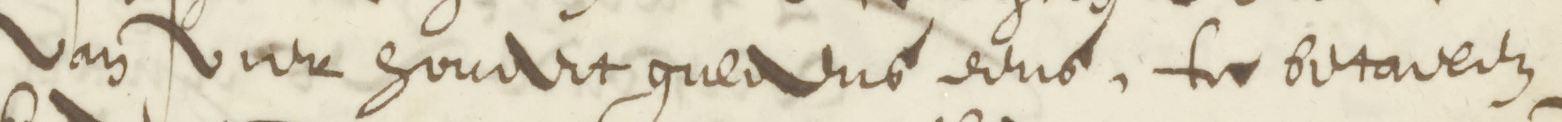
van vier hondert guldens eens, te betaelen
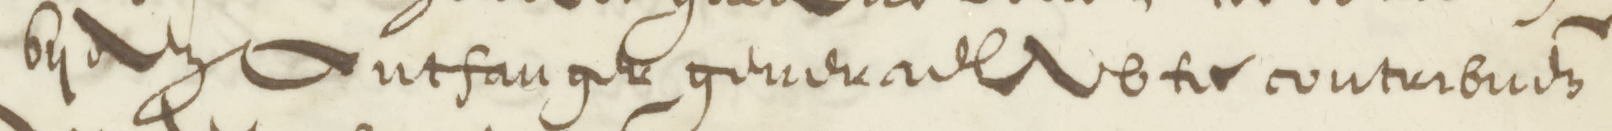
byden Ontfanger generael Wte contribuen
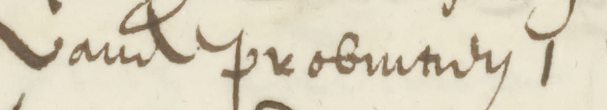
vande provintien.
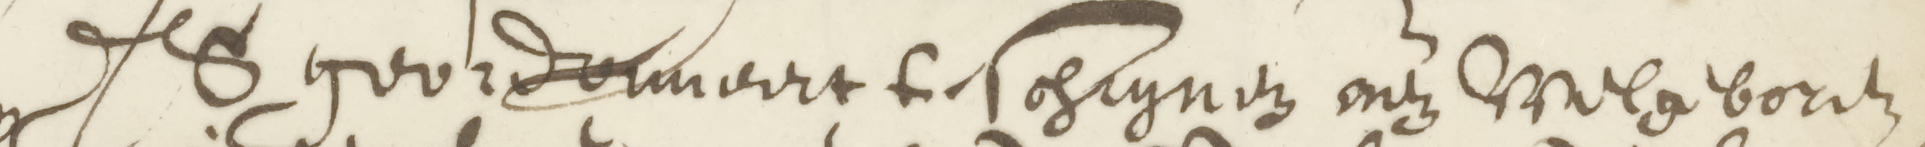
Is geordonneert te schlyuen aen Welgeboren
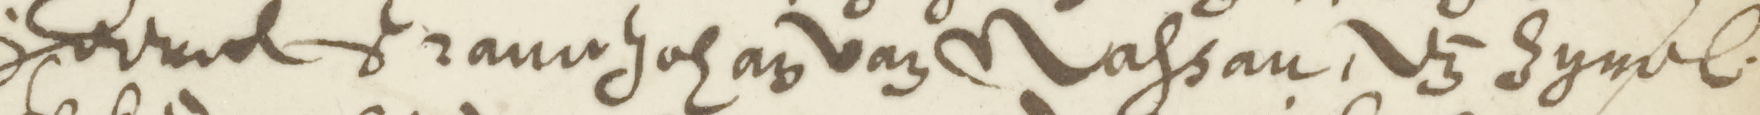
d'heere Grave Johan van Nassau, en zyne l.
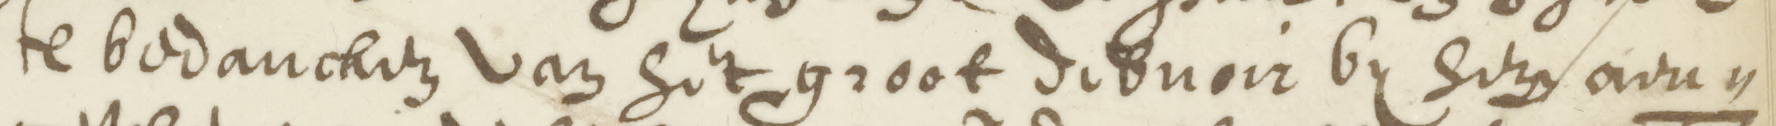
te bedancken van het groot debuoir by hem aen„
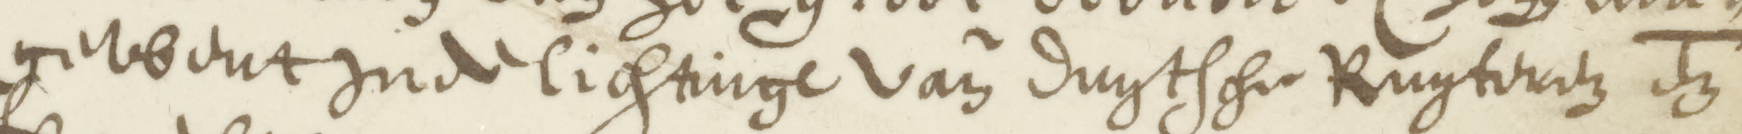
gewent inde lichtinge van duytsche Ruyteren en
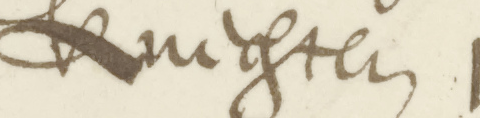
Knechten.
